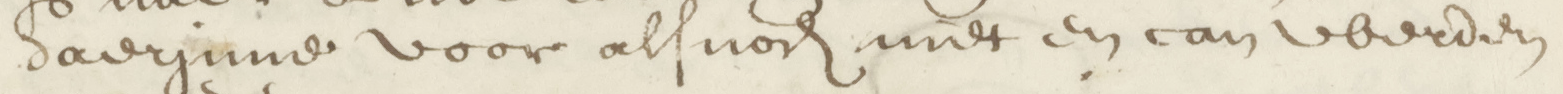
daerinne voor alsnoch niet en can werden
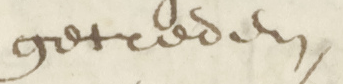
getreden.
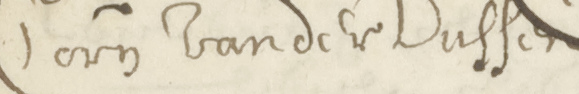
Corn. vander Dussen
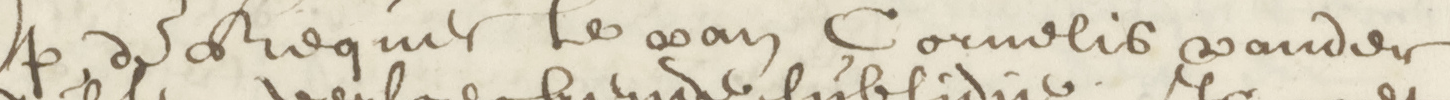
Op de Requeste van Cornelis vander
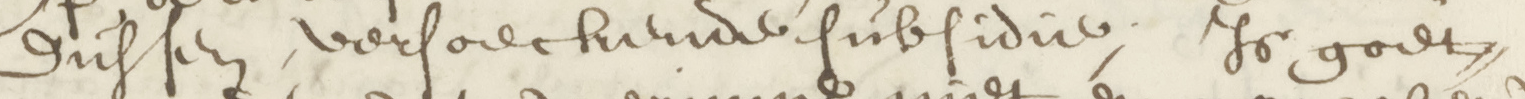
Dussen, versoeckende subsidie, Is goet„
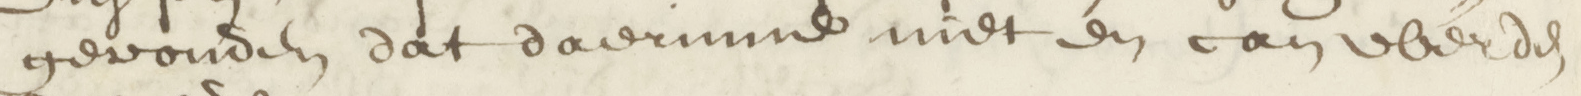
gevonden dat daerinne niet en can werden
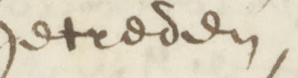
getreden.
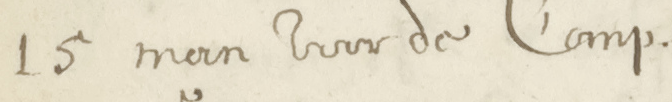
15 man voor de Comp.
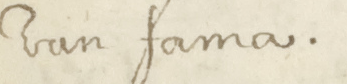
van fama
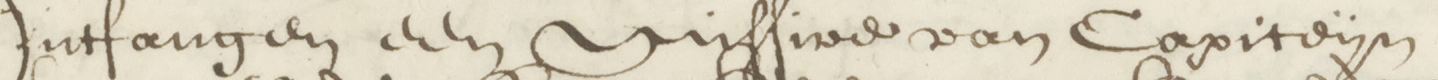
Ontfangen een Missive van Capiteijn
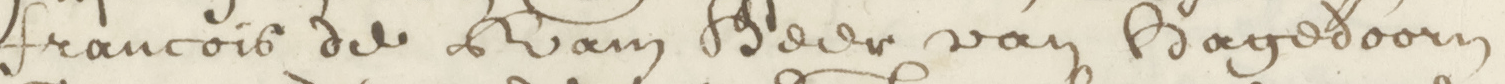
francois de Ram Heer van Hagedoorn
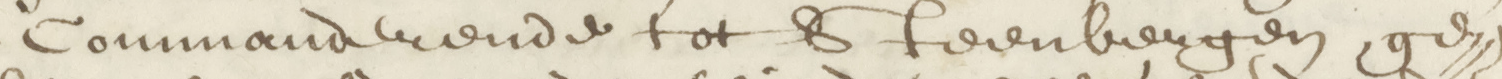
Commanderende tot Steenbergen, ge„
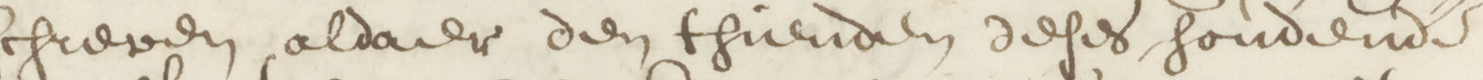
schreven aldaer den thienden deses, houdende
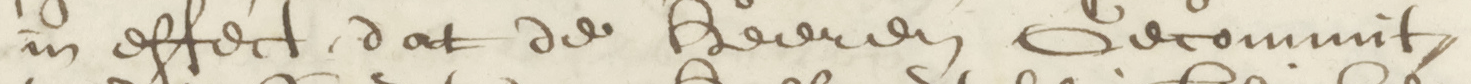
in effect, dat de Heeren Gecommit„
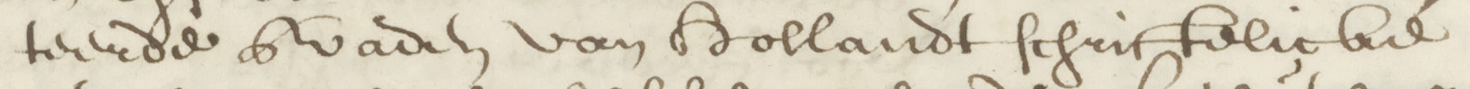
teerde Raden van Hollandt schriftelicke
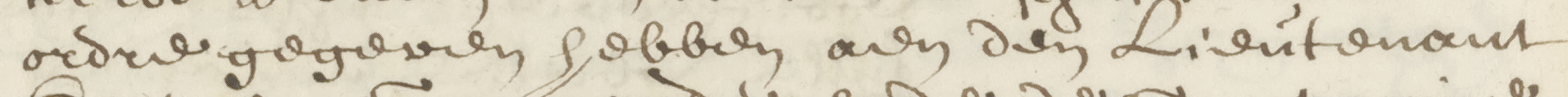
ordre gegeven hebben aen den Lieutenant
